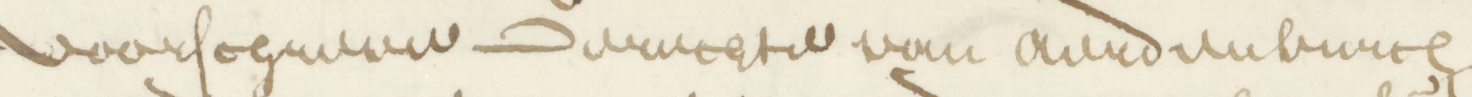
voorschreve Gerechte van Aerdenburch
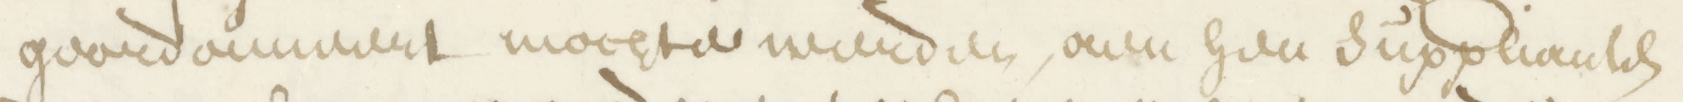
geordonneert mochte werden, aen hen Supplianten
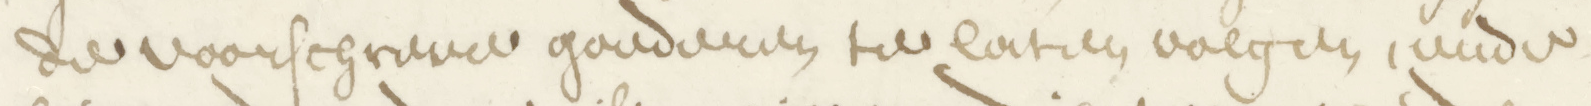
de voorschreve goederen te laten volgen, ende
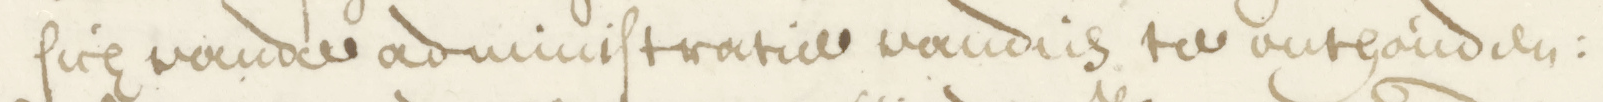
sich vande administratie vandien te onthouden:
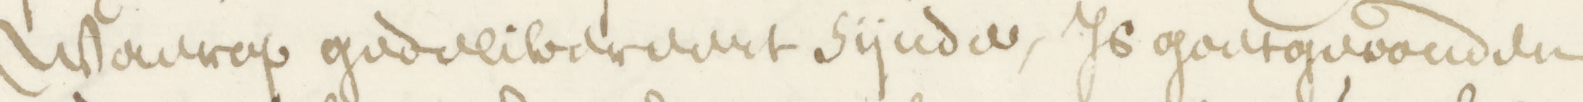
Waerop gedelibereert sijnde, Is goetgevonden
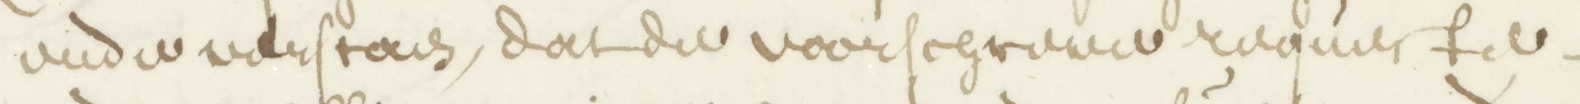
ende verstaen, dat de voorschreve requeste
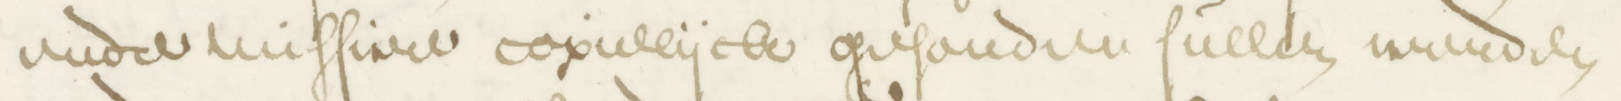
ende missive copielijck gesonden sullen werden
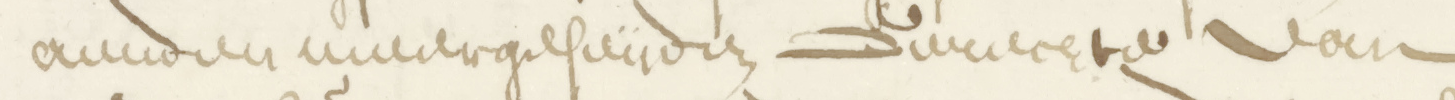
aenden meergeseijden Gerechte van
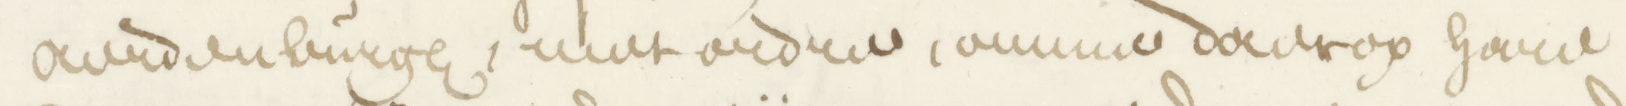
Aerdenburgh, met ordre, omme daerop hare
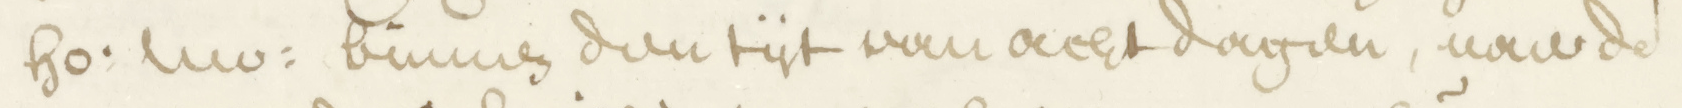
ho:Mo: binnen den tijt van acht dagen, nae de
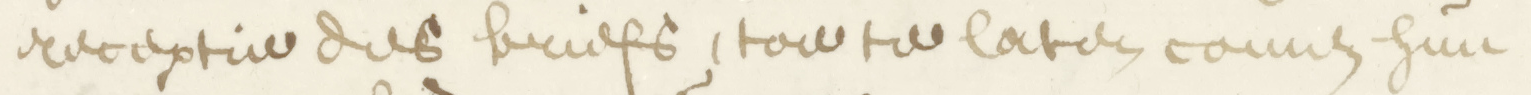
receptie des briefs, toe te laten comen hun
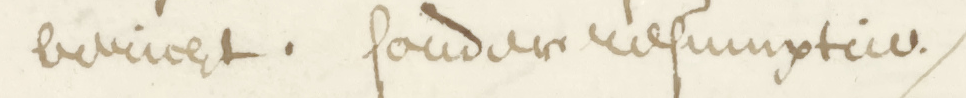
bericht. sonder resumptie.
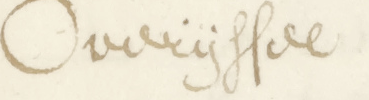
Overijssel
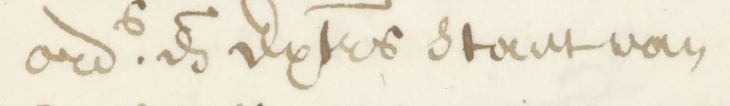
ords. en Extrs Staet van
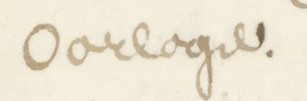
Oorloge.
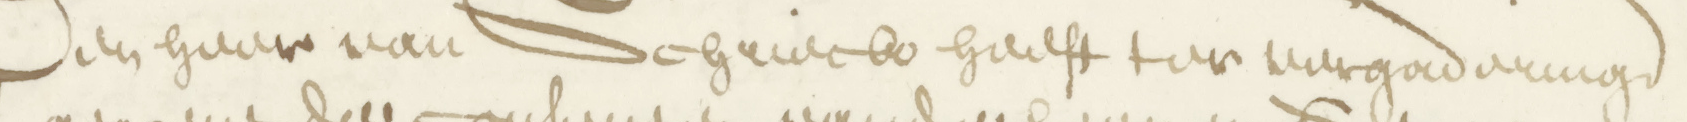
Den heer van Schrieck heeft ter vergaderinge
